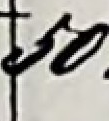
50
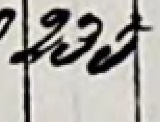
235
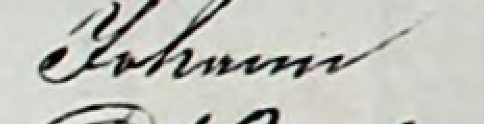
Johann
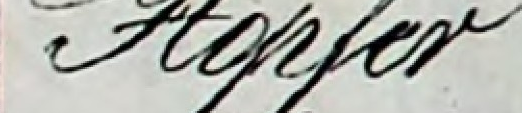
Hopfer
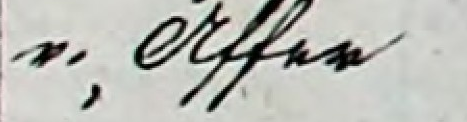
v. Affer
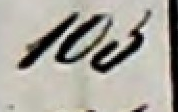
103
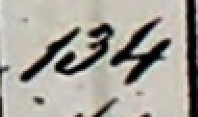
134
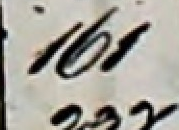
161
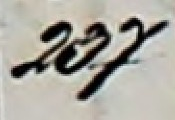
237
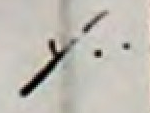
./.
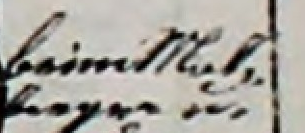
Beim Malz„
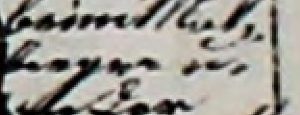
berger u.
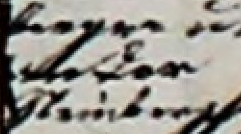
von der
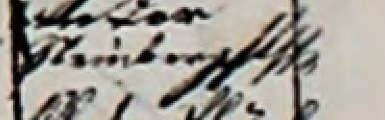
Steinbergstrasse
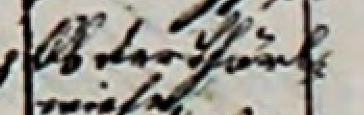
Ab der Thör„
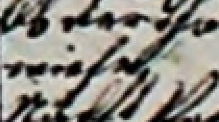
wies
